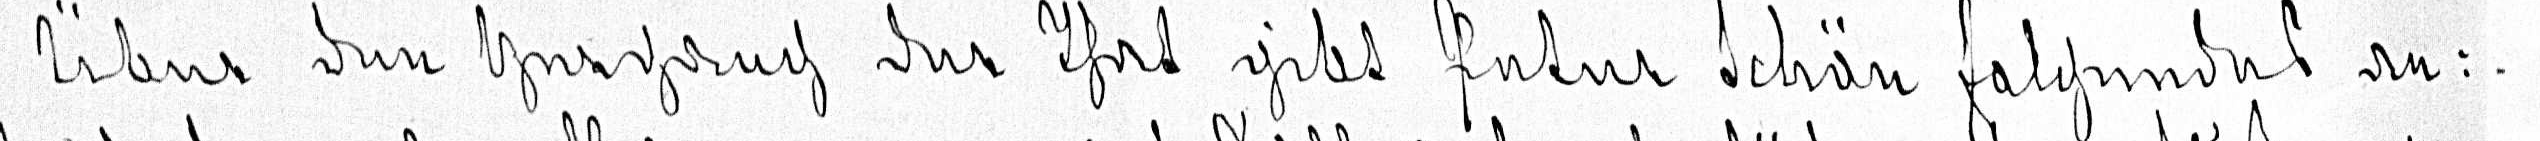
Über den Hergang der That gibt Peter Schön folgendes an:
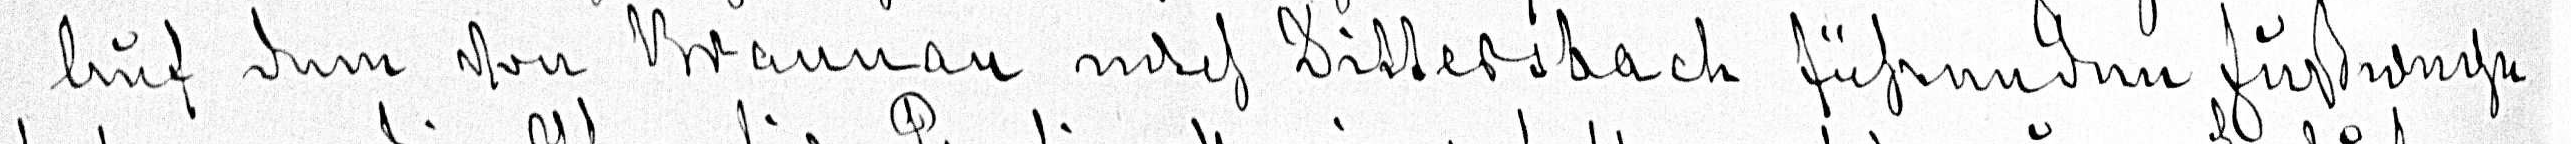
Auf dem von Braunau nach Dittersbach führenden Fußwege
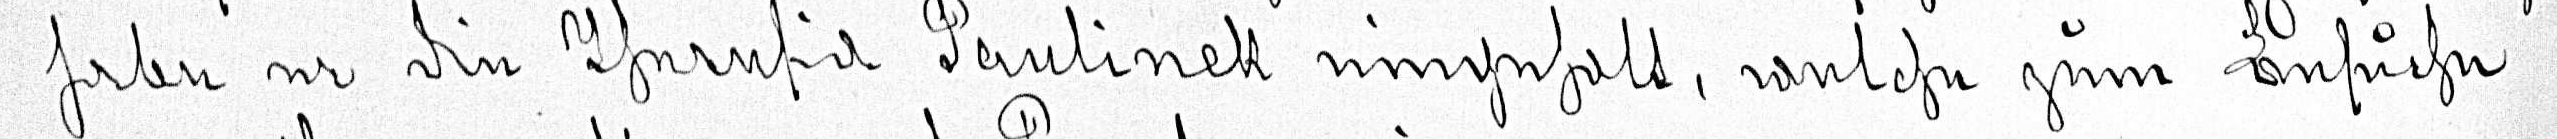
habe er die Theresia Paulinek eingeholt, welche zum Besuche
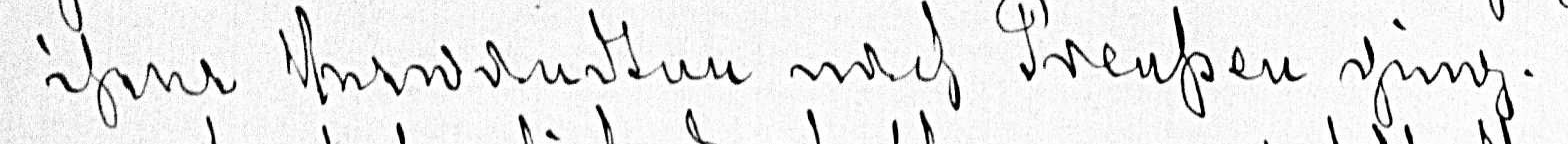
ihrer Verwandten nach Preußen ging.
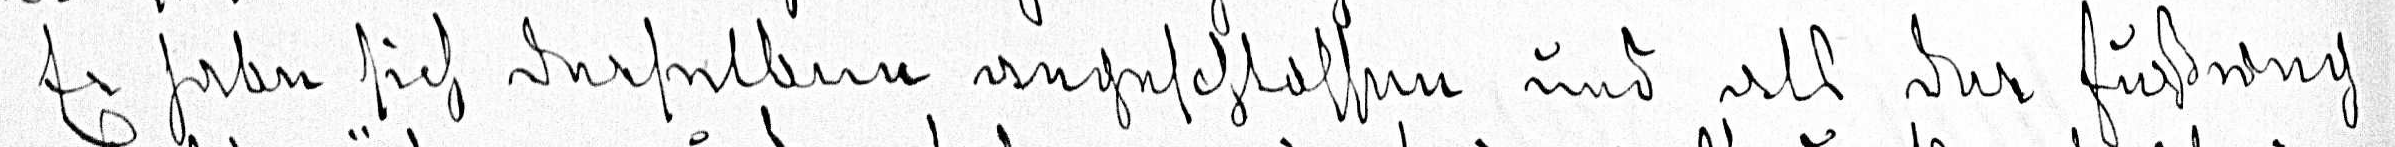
Er habe sich derselben angeschlossen und als der Fußweg
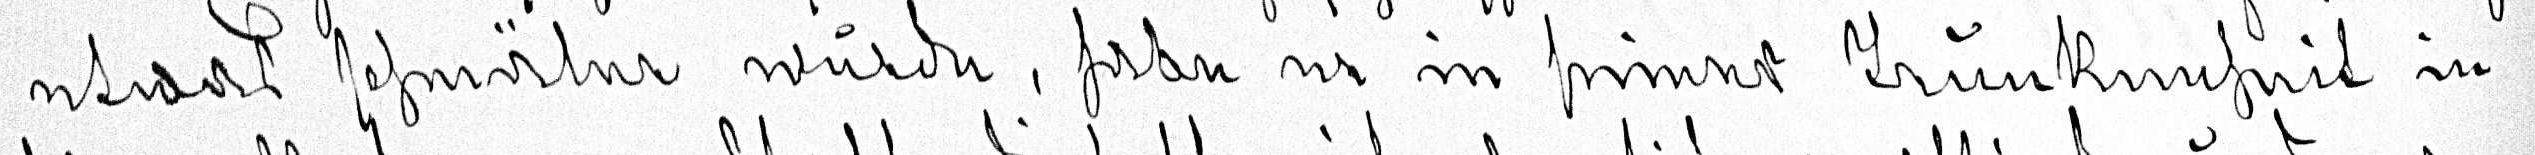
etwas schmäler wurde, habe er in seiner Trunkenheit in
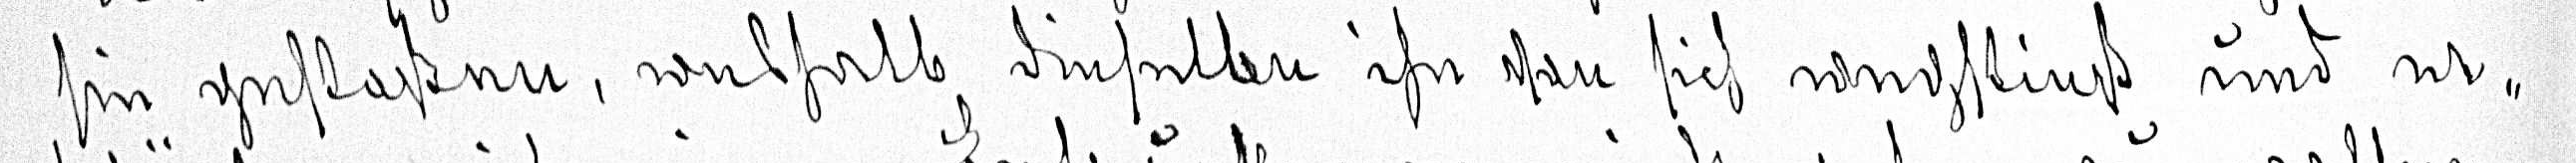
sie gestoßen, weshalb dieselbe ihn von sich wegstieß und er¬
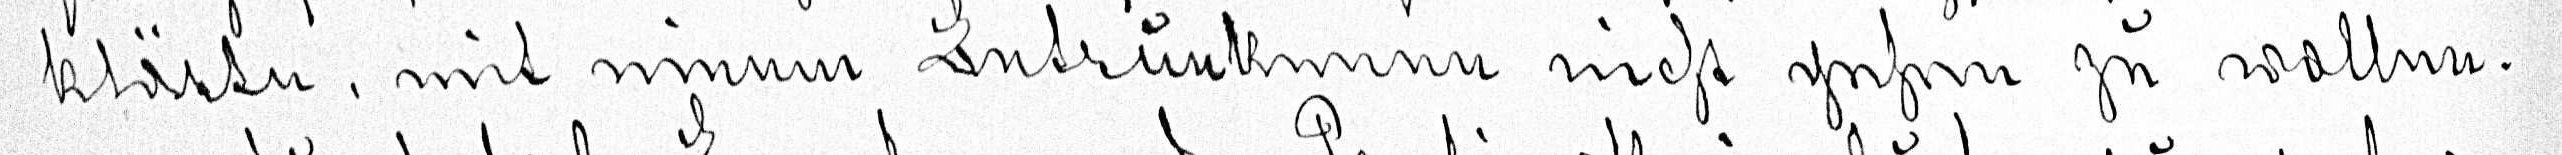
klärte, mit einem Betrunkenen nicht gehen zu wollen.
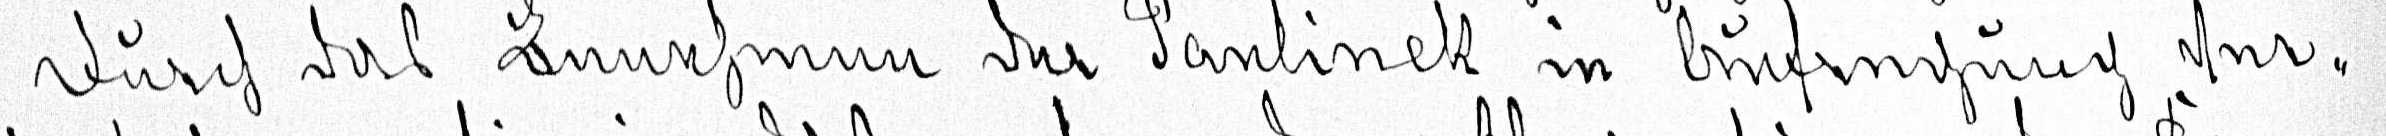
Durch das Benehmen der Paulinek in Aufregung ver¬
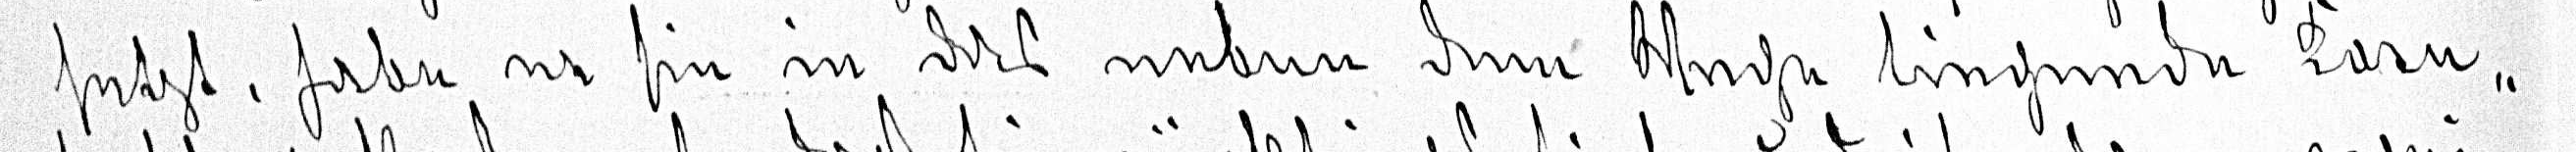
setzt, habe er sie in das neben dem Wege liegende Korn¬
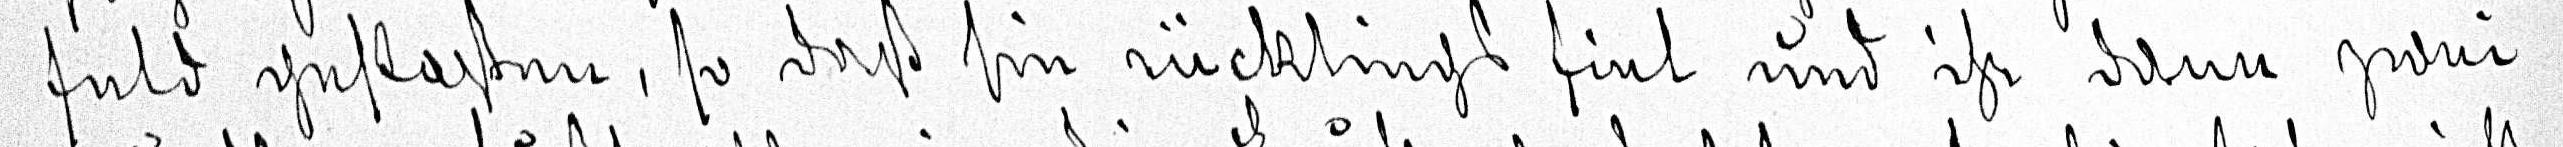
feld gestoßen, so daß sie rücklings fiel und ihr dann zwei
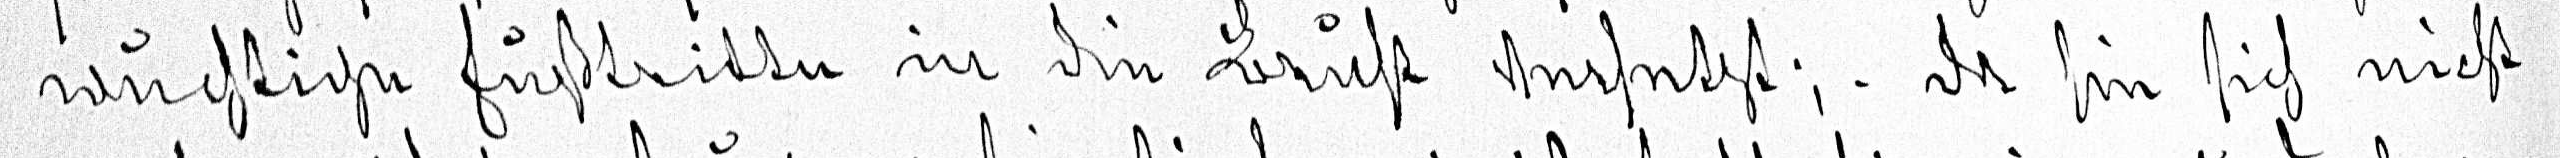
wuchtige Fußtritte in die Brust versetzt; da sie sich nicht
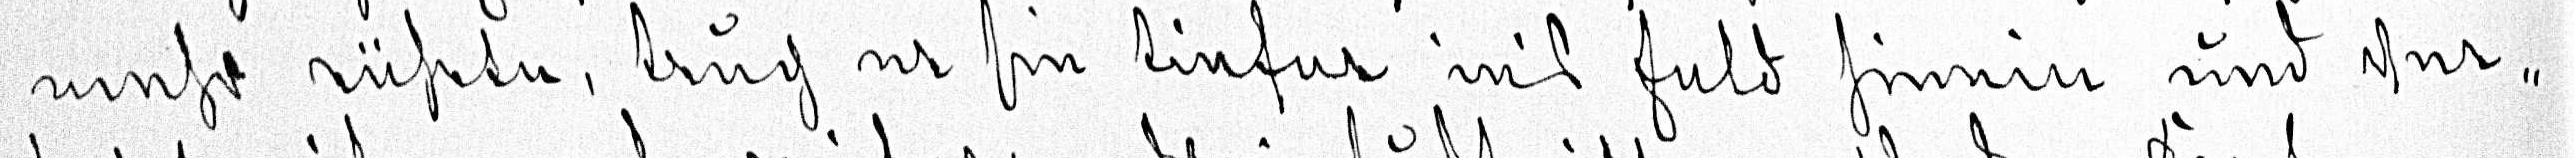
mehr rührte, trug er sie tiefer ins Feld hinein und ver¬
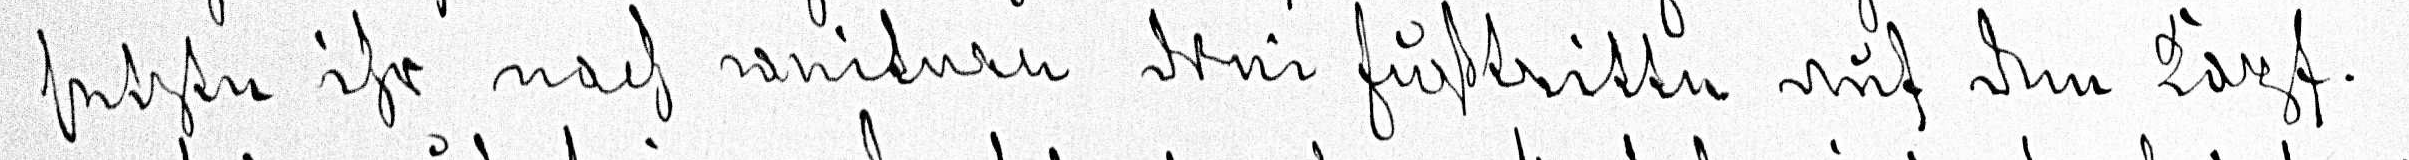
setzte ihr nach weitere drei Fußtritte auf den Kopf.
